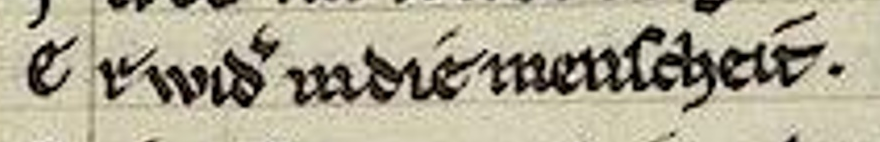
Er wid(er) indie menſcheit.
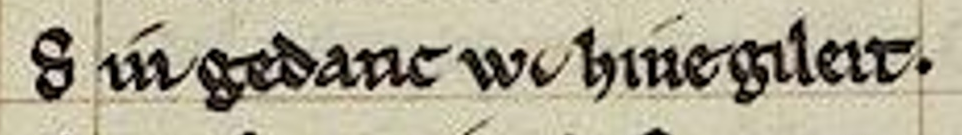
Sin gedanc w(az) hine gileit.
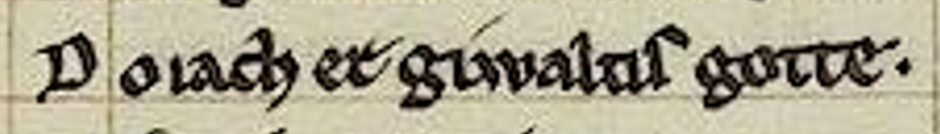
Do iach er giwaltiſ gotte.
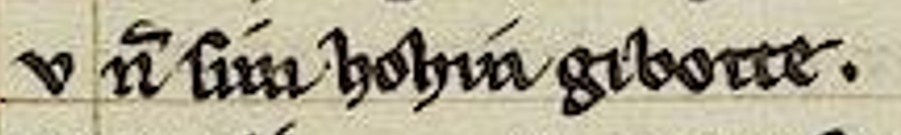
Vn(d) ſim hohin gibotte.
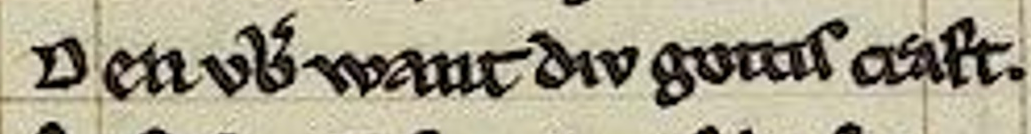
Den vb(er) want div gottiſ craft.
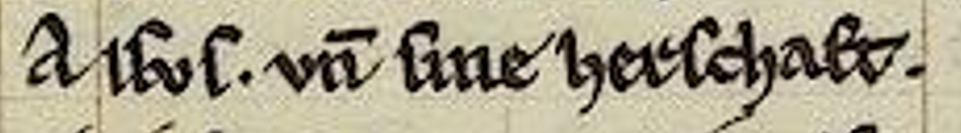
Alſvſ. vn(d) ſine herſchaft.
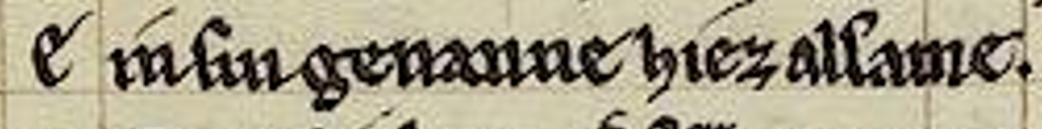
Ein ſin genanne hiez alſame.
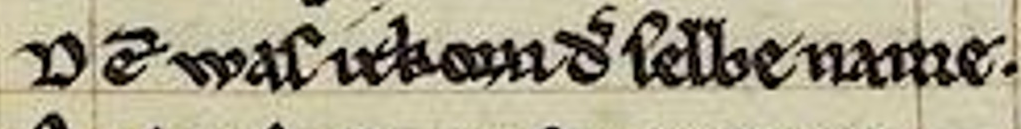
De(m) waſ irkorn d(er) ſelbe name.
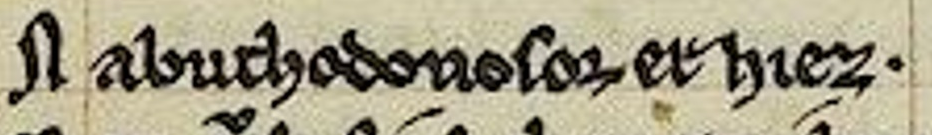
Nabuchodonoſor er hiez.
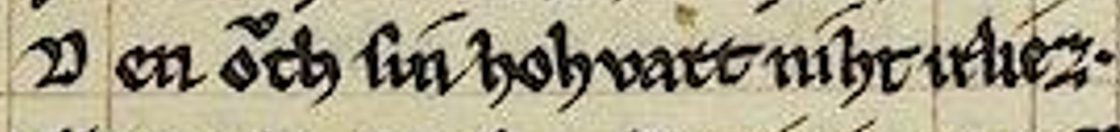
Den o°vch ſin hohvart niht irliez.
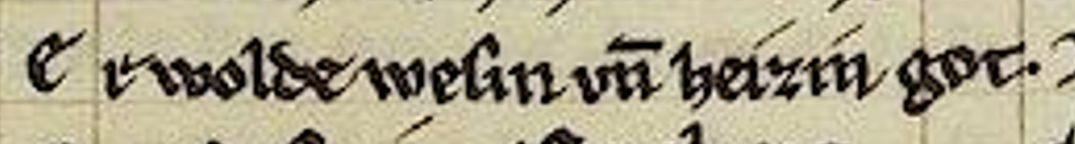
Er wolde weſin vn(d) heizin got.
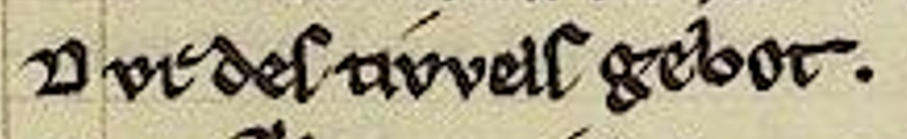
Dvr deſ tivvelſ gebot.
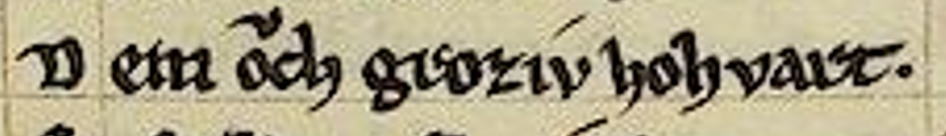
Dem o°vch groziv hohvart.
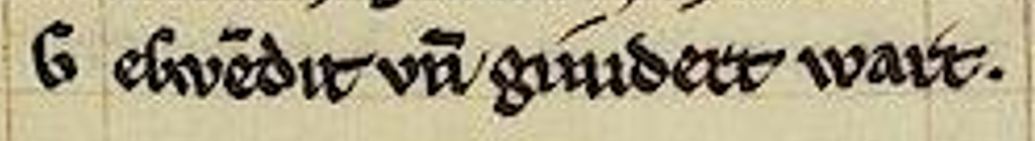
Geſwe(n)dit vn(d) genidert wart.
